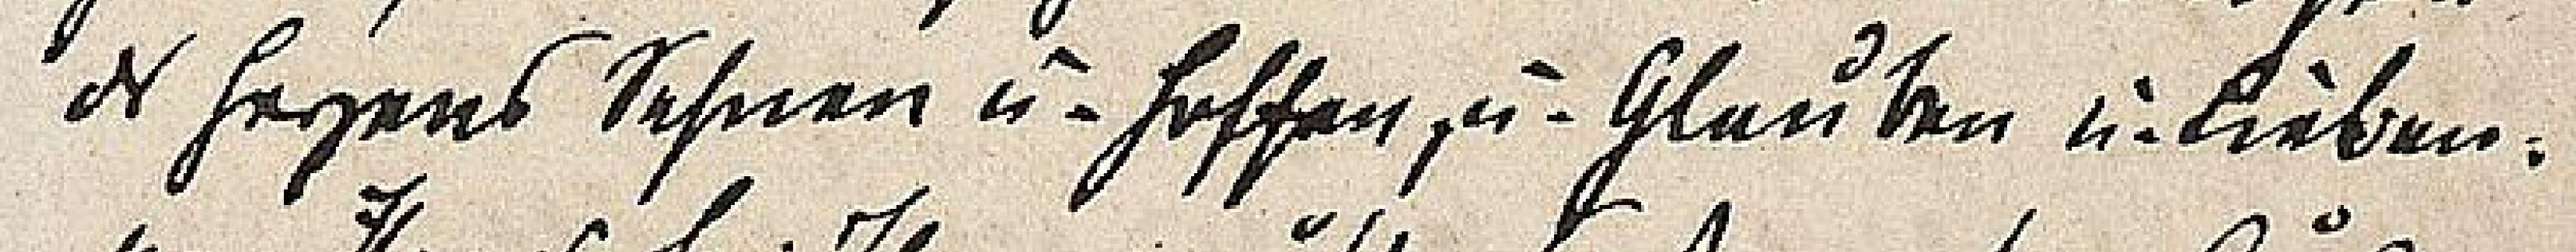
ds Herzens Sehnen u. Hoffen u. Glauben u. Lieben:
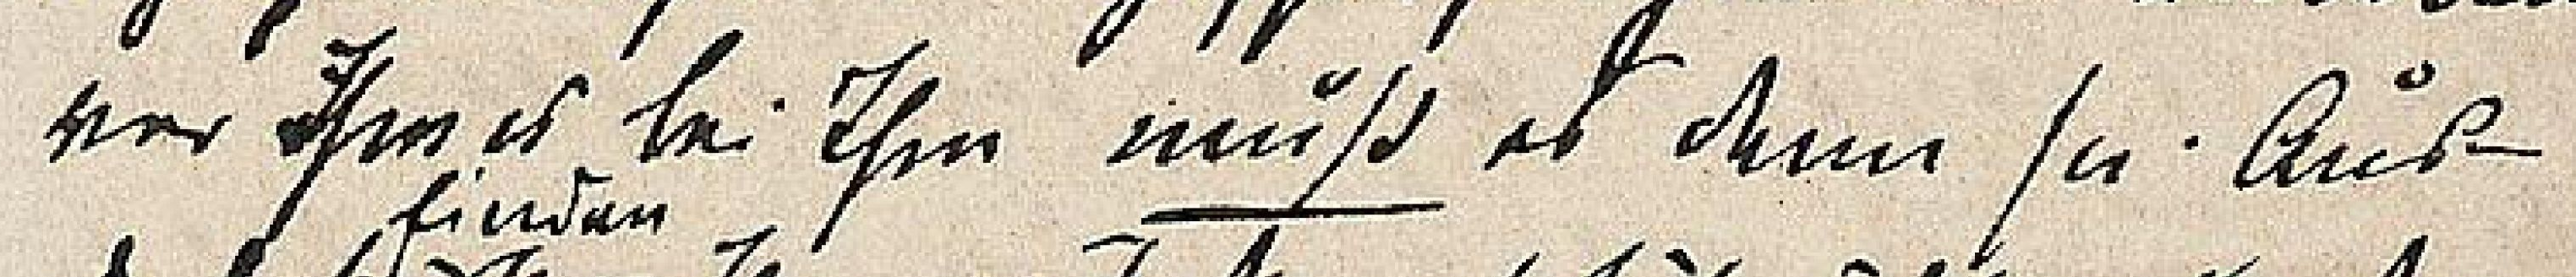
vor Jsm u. bei Ihm, müßt es denn sn. Aus¬
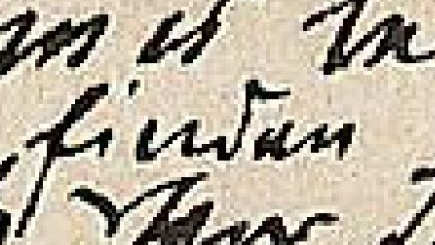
finden
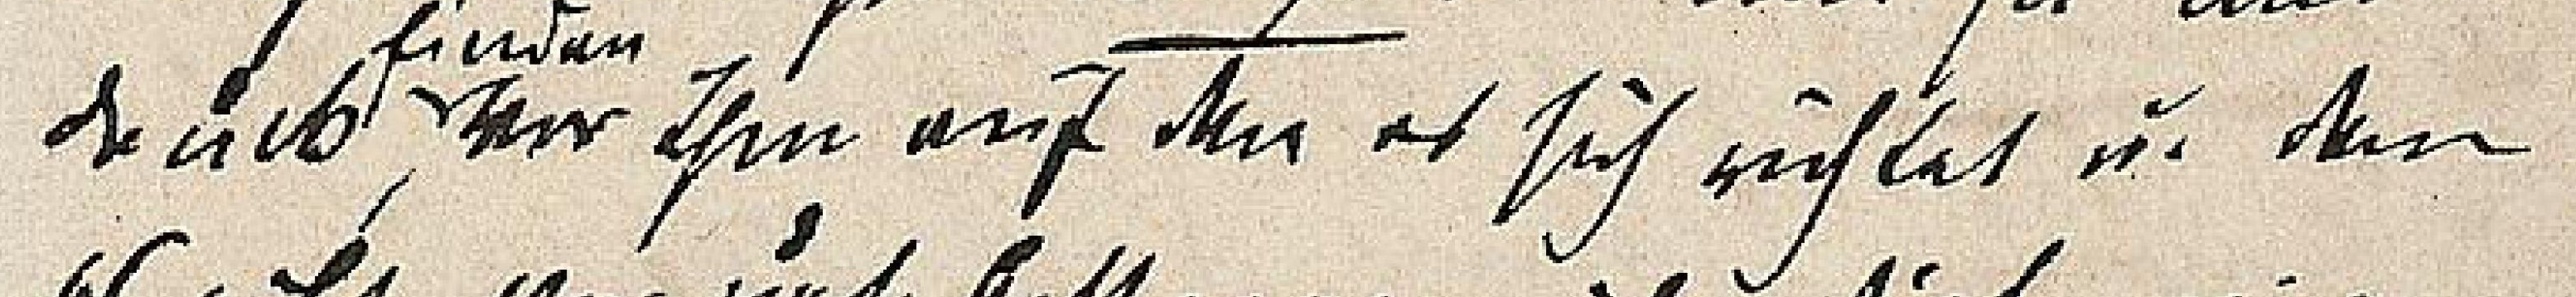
druck vor Ihm auf den es sich richtet u. dem
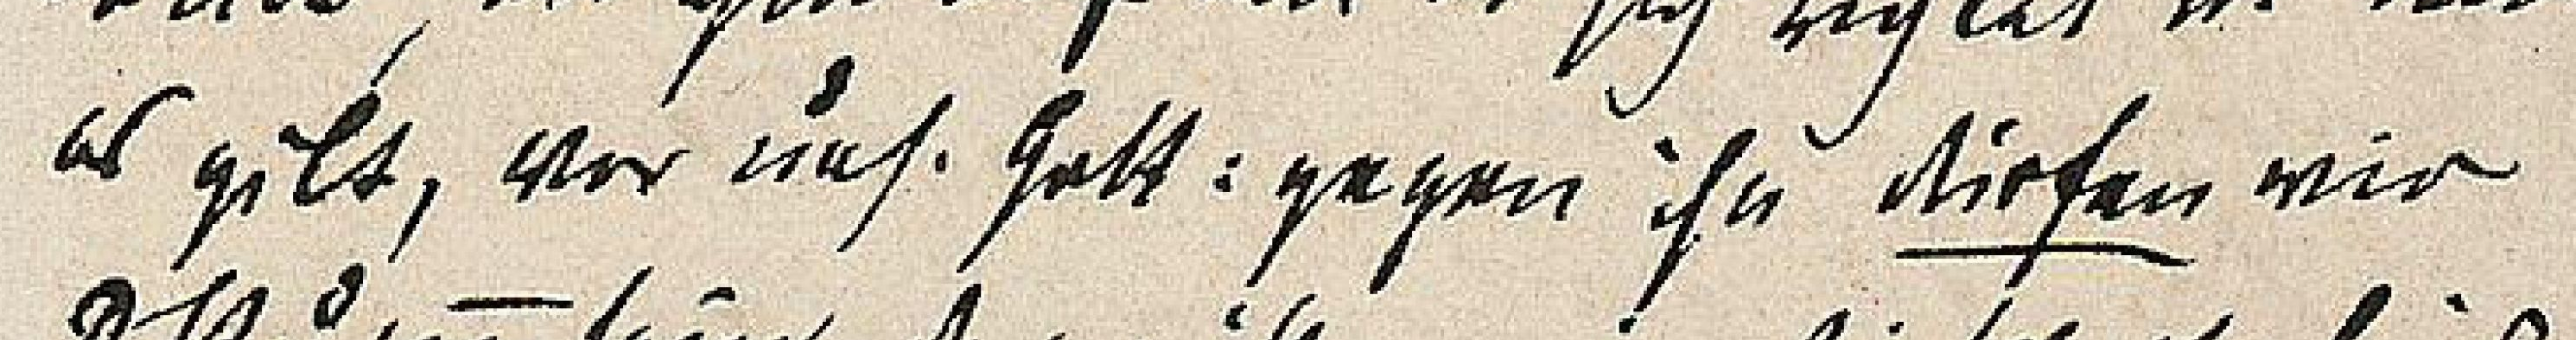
es gilt, vor uns. Gott: gegen ihn dürfen wir
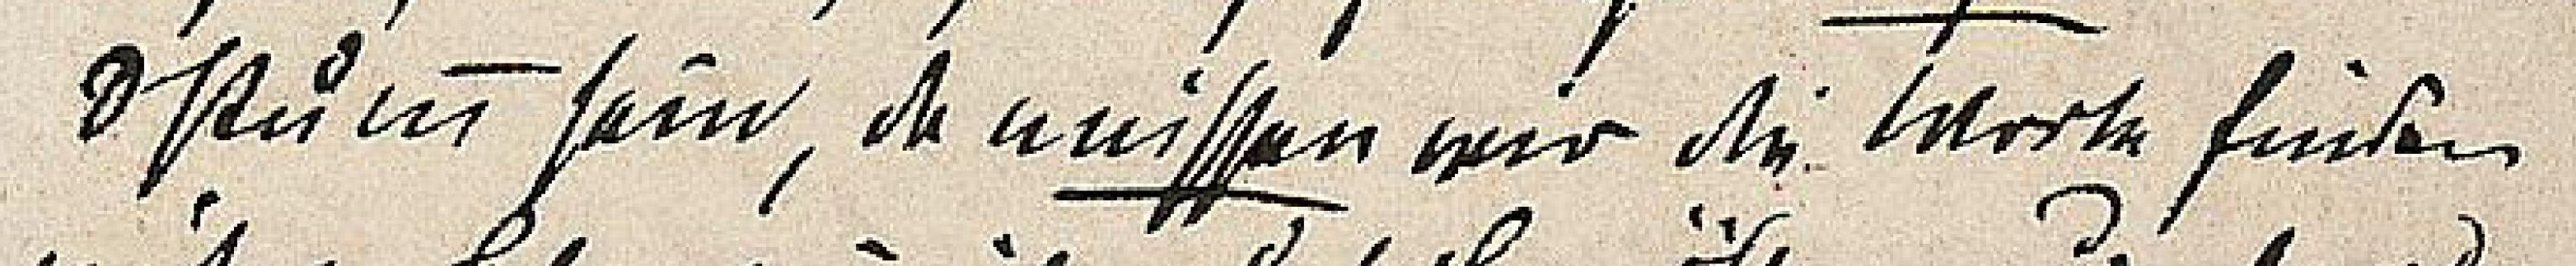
o stum sein, da müssen wir die Worte finden
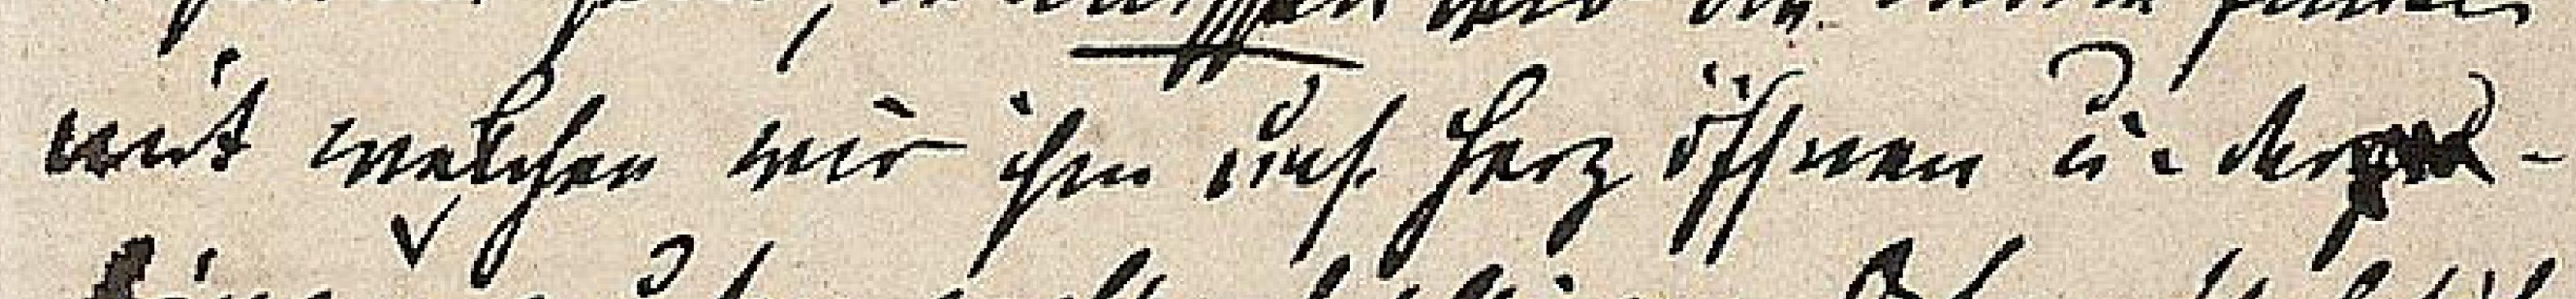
mit welchen wir ihm des Herz öffnen u. dar¬
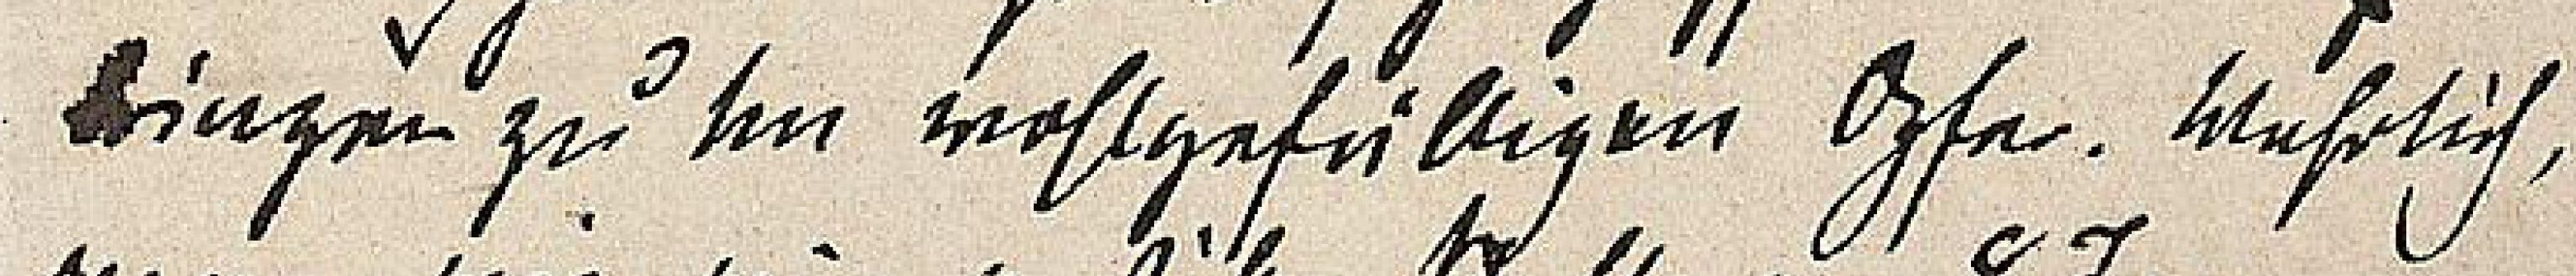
bringen zu sm wohlgefälligen Opfer. Wahrlich,
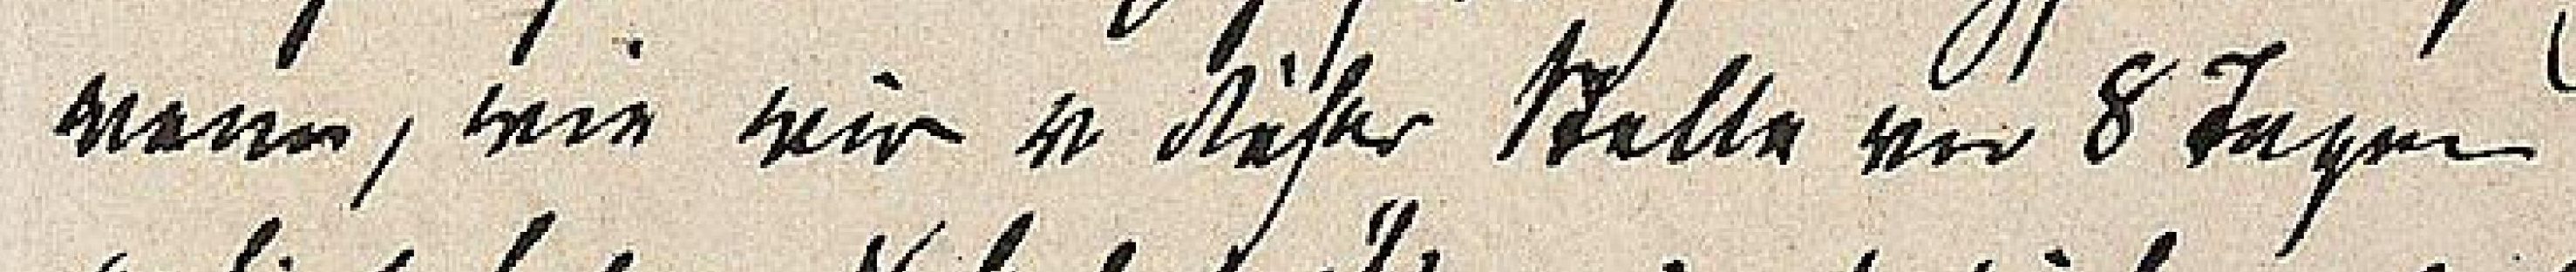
wenn, wie wir v. dieser Stelle vor 8 Tagen
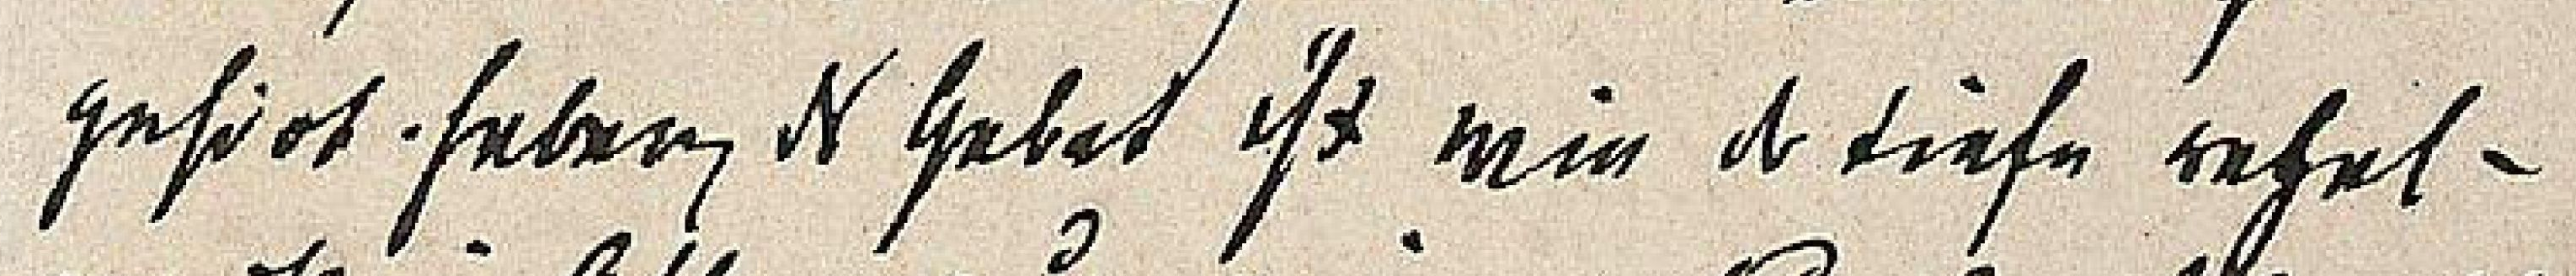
gehört. haben, ds Gebet ist wie der tiefe regel¬
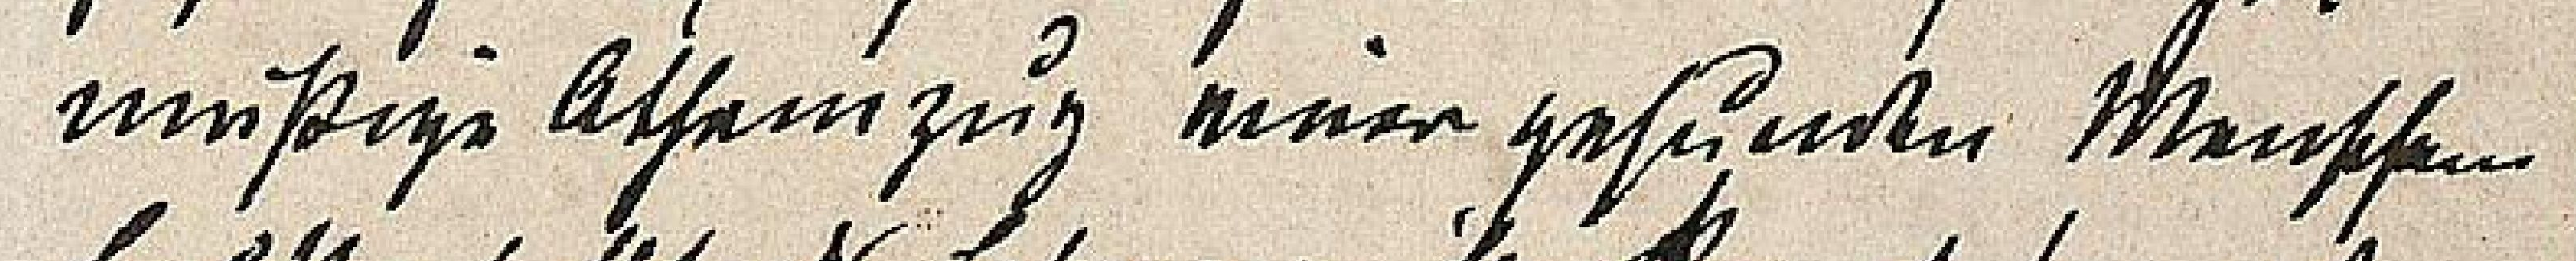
mäßigen Athemzug einer gesunder Menschen¬
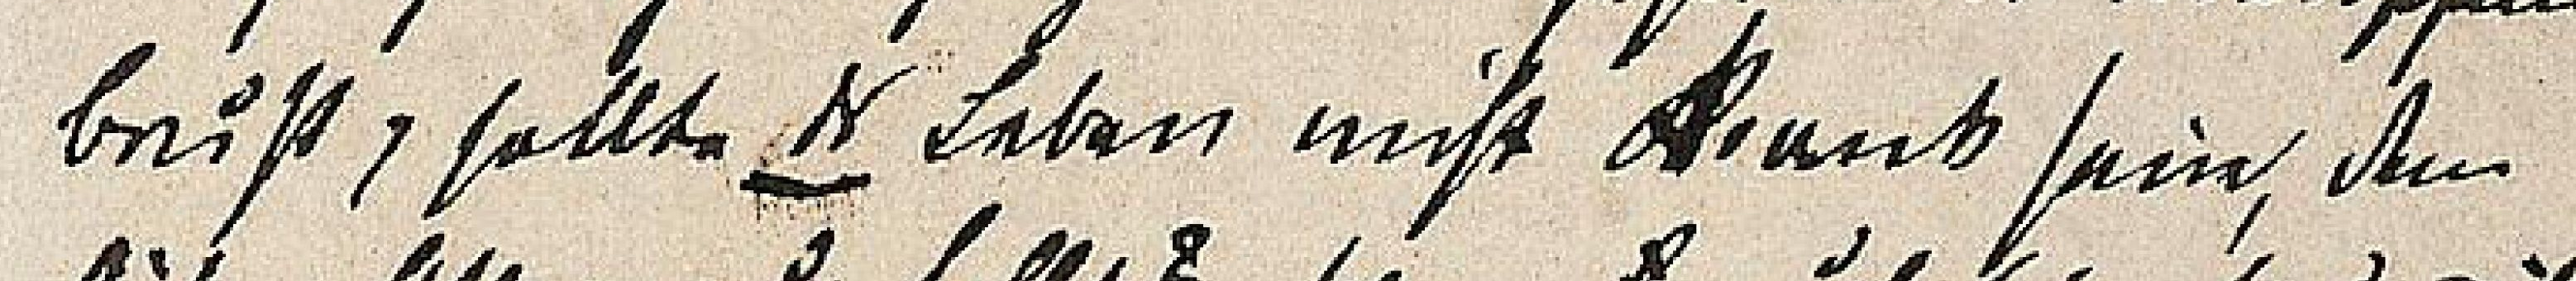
brust, sollte das Leben nicht krank sein, dem
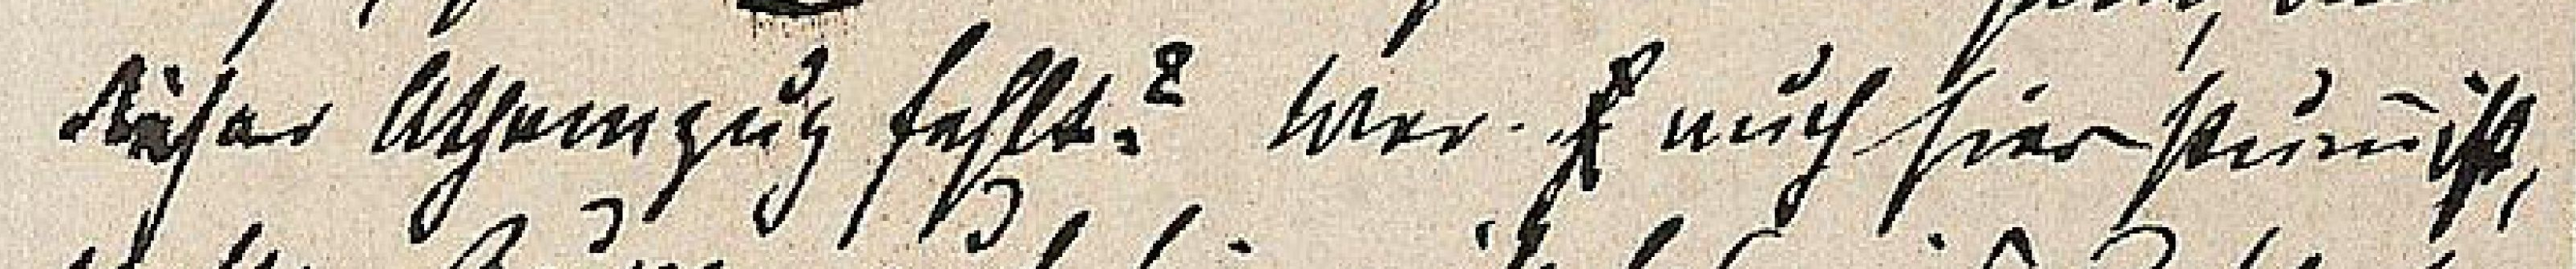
dieser Athemzug fehlt? Wer auch hier stum ist,
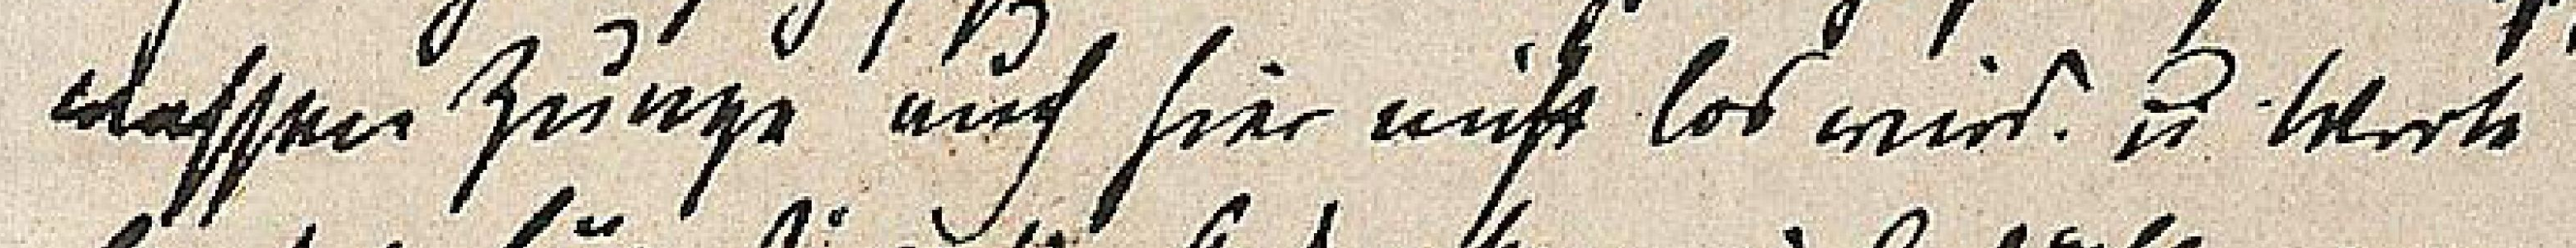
wessen Zunge auch hier nicht los wird. u Worte
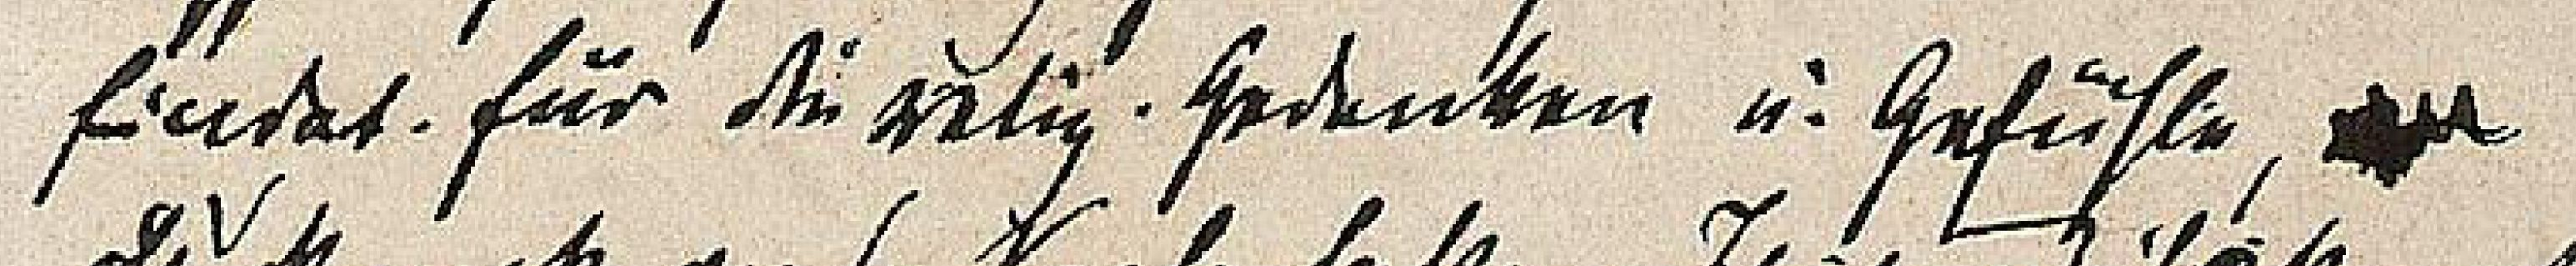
findet für die relig. Gedanken u. Gefühle an
